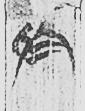於
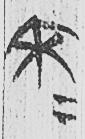宋=
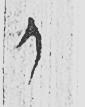人
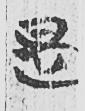是
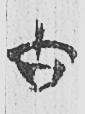古
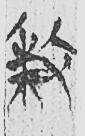殺
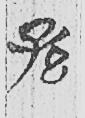孫
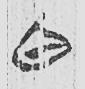白
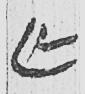亡
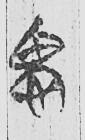愄
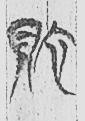{貝它}
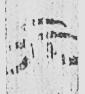亓
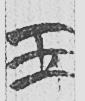玉
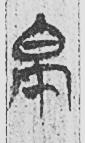帛
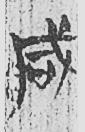戕
